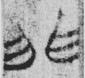非
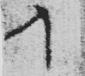人
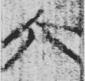六
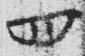四
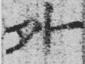外
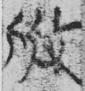○（比）
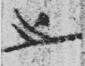之
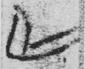亡（无）
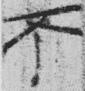不
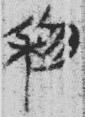利
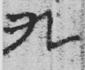九
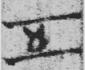五
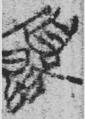顯
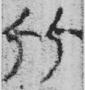比
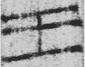王
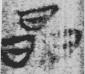晶（三）
